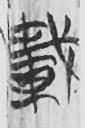載
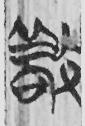敬
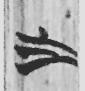之
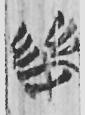𪪋（哉）
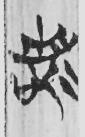若
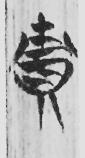賈
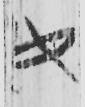女
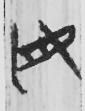母
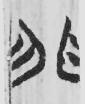非
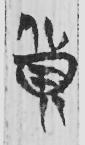貨
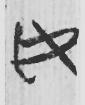女
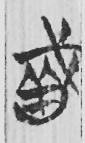戠
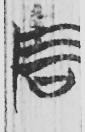石
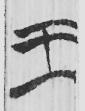王
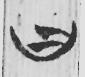曰
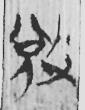敓（說）
